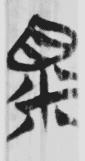眔
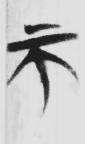帀
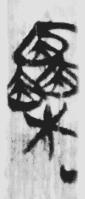栗
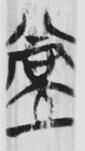當
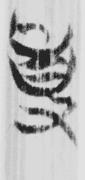事
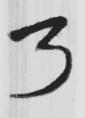乃
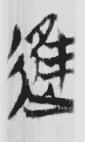進
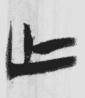亡
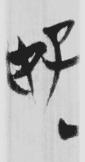好
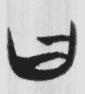曰
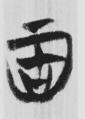固
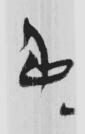身
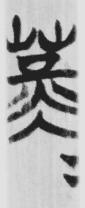蓳=
